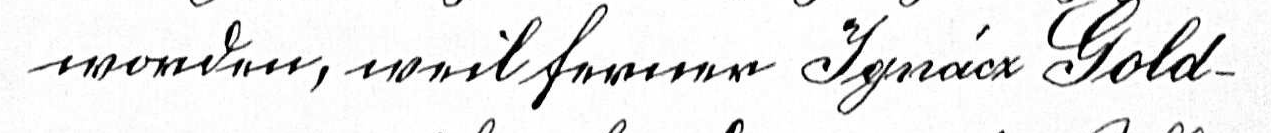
worden, weil ferner Jgnácz Gold¬
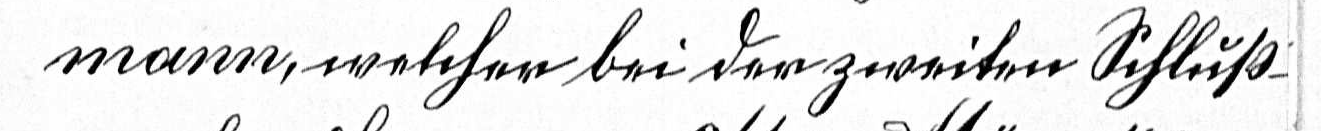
mann, welcher bei der zweiten Schluß¬
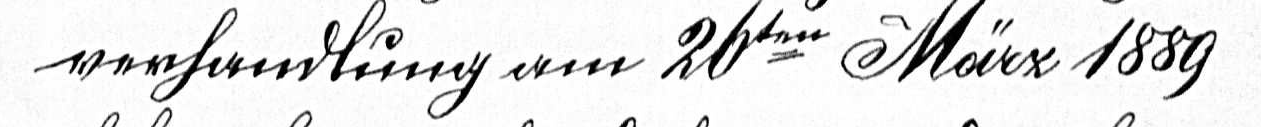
verhandlung am 26ten März 1889
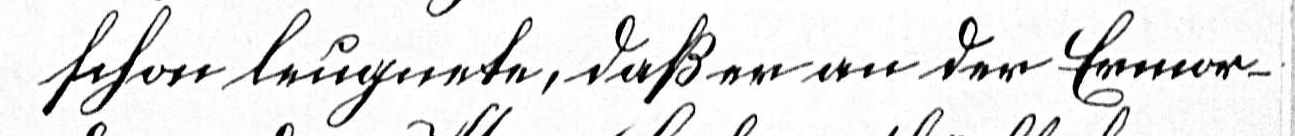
schon leugnete, daß er an der Ermor¬
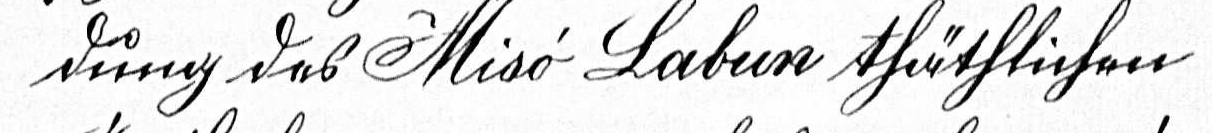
dung des Misó Labun thäthlichen
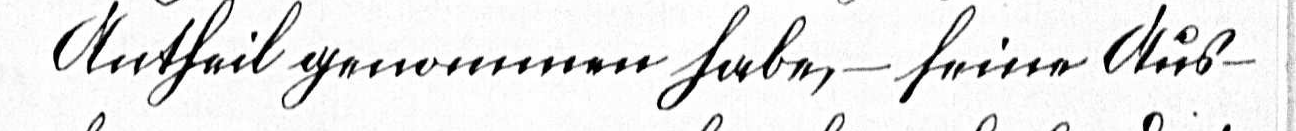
Antheil genommen habe,- seine Aus¬
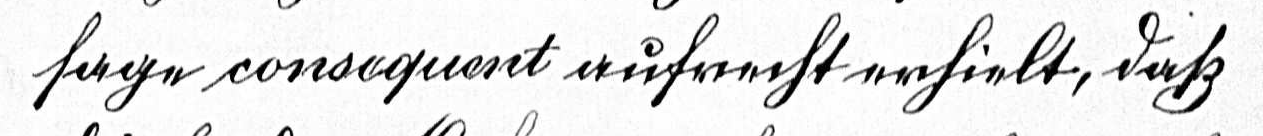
sage consequent aufrecht erhielt, daß
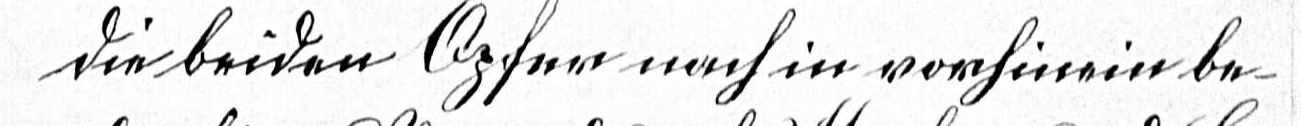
die beiden Opfer nach in vorhinein be¬
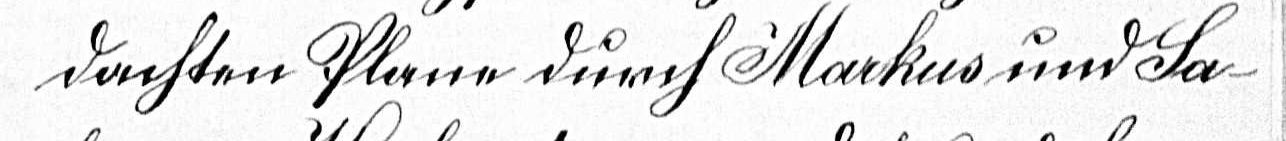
dachten Plane durch Markus und Sa¬
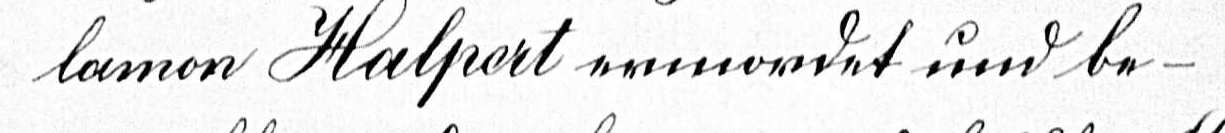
lamon Halpert ermordet und be¬
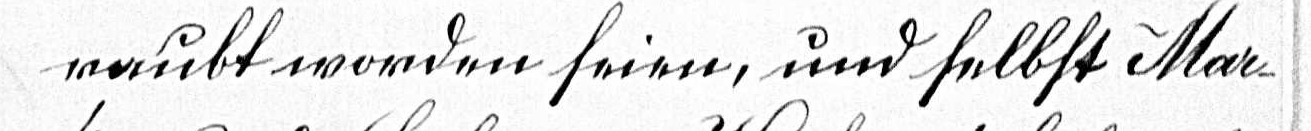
raubt worden seien, und selbst Mar¬
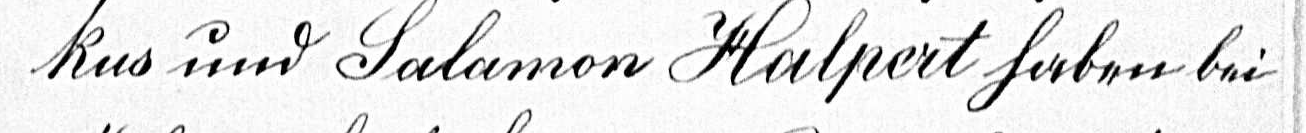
kus und Salamon Halpert haben bei
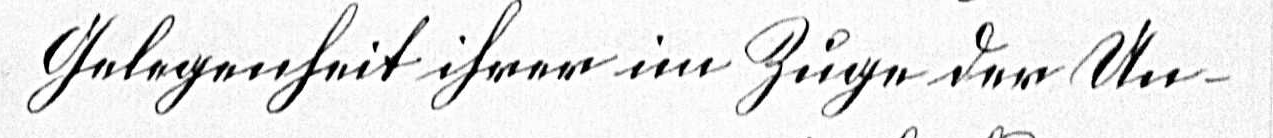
Gelegenheit ihrer im Zuge der Un¬
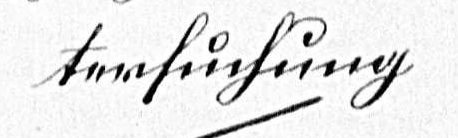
tersuchung
